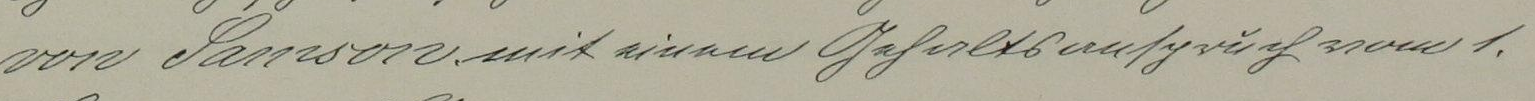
von Samson mit einem Gehaltsanspruch vom 1.
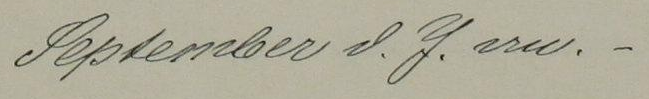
September d.J. an.
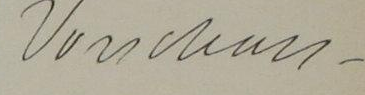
Vorschuss
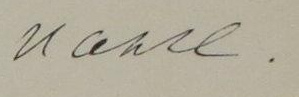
kasse
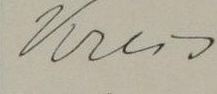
Kreis
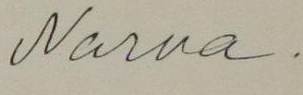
Narva
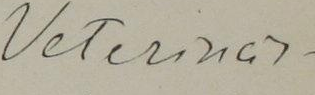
Veterinär
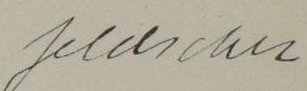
feldscher
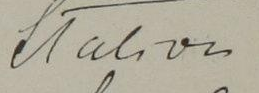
Station
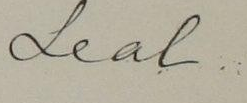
Leal
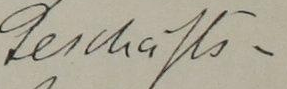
Geschäfts-
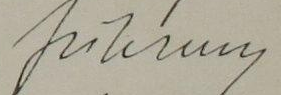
führung
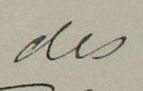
des
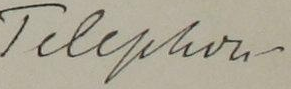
Telephon-
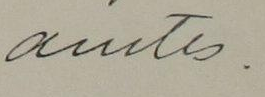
amtes
